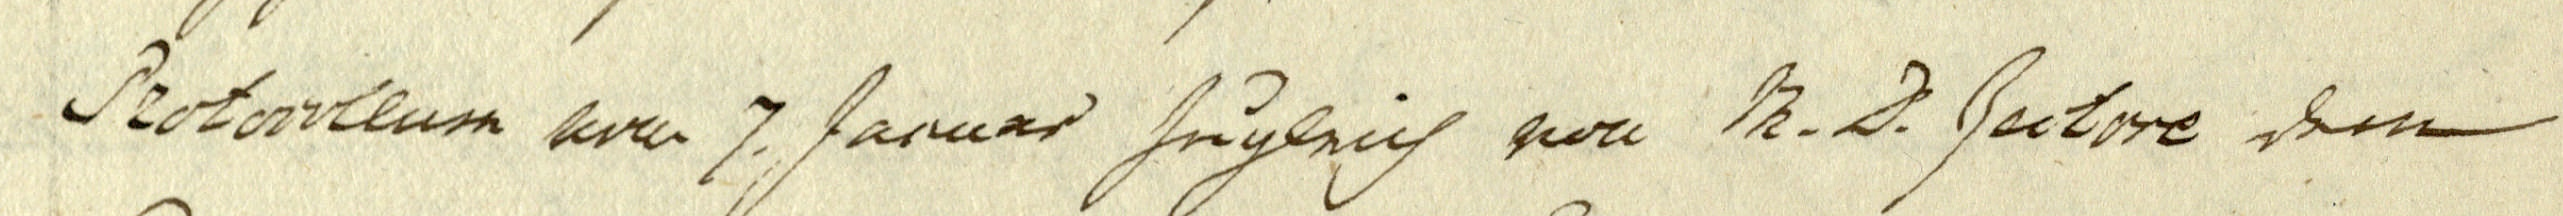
Protocollum vom 7. Januar zugleich von M. D. Rectore dem
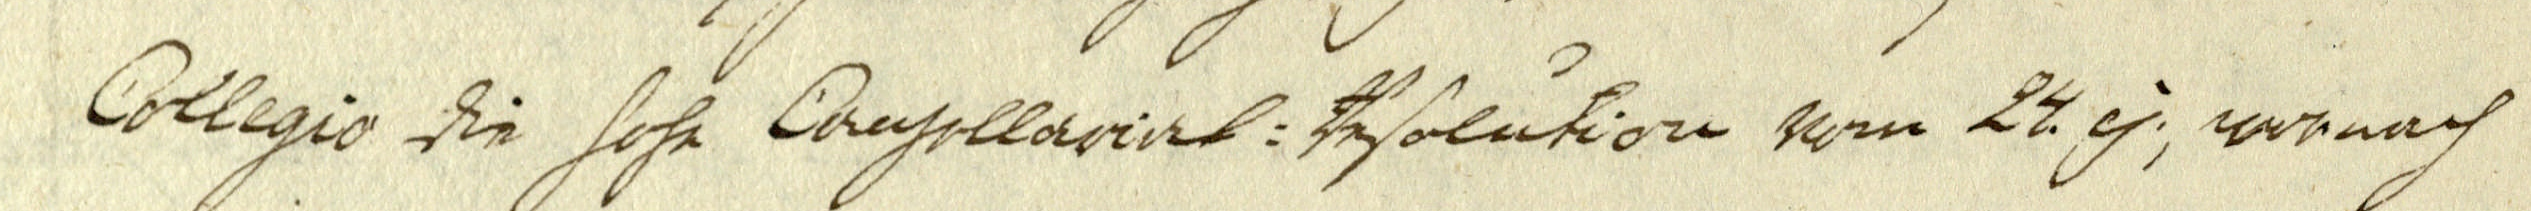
Collegio die hohe Canzellariat-Resolution vom 24. ej., wornach
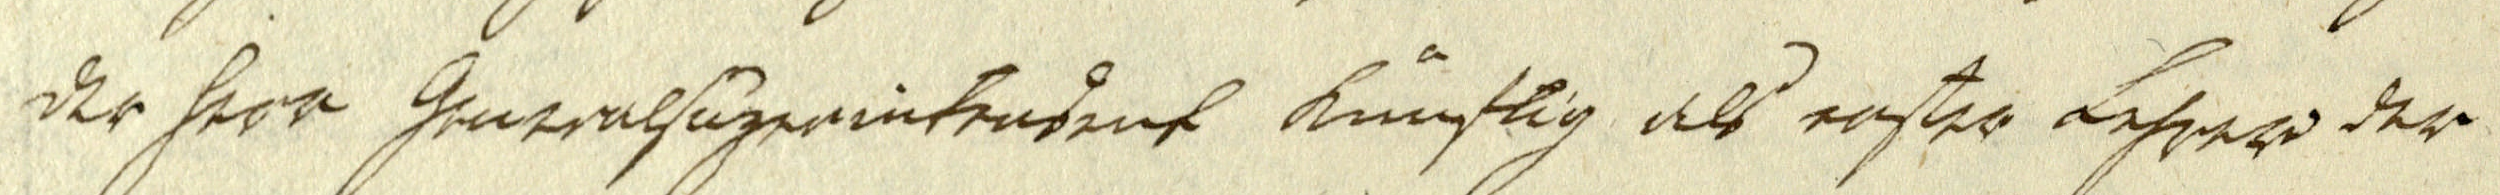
der herr Generalsuperintendent künftig als erster Lehrer der
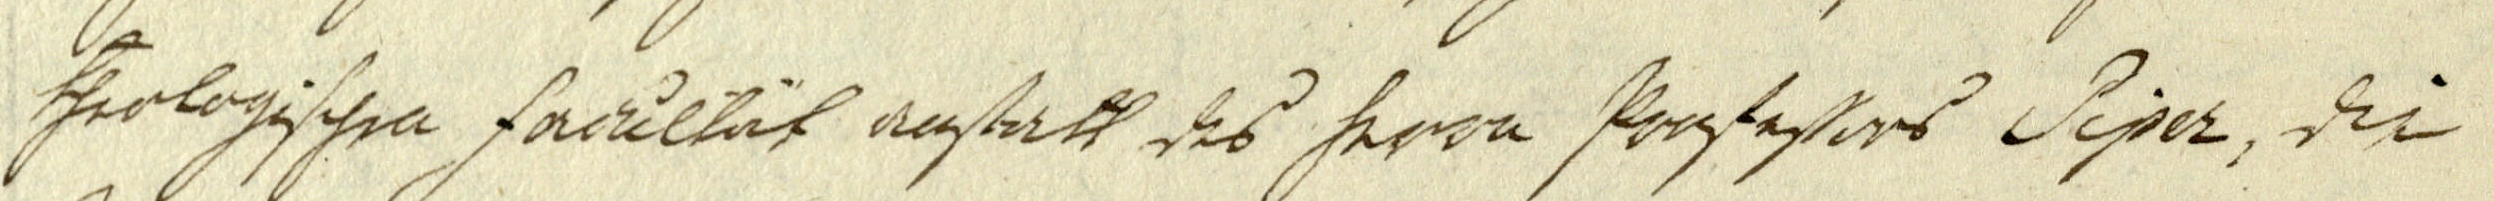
Theologischen Fakultät anstatt des herrn Professors Piper, die
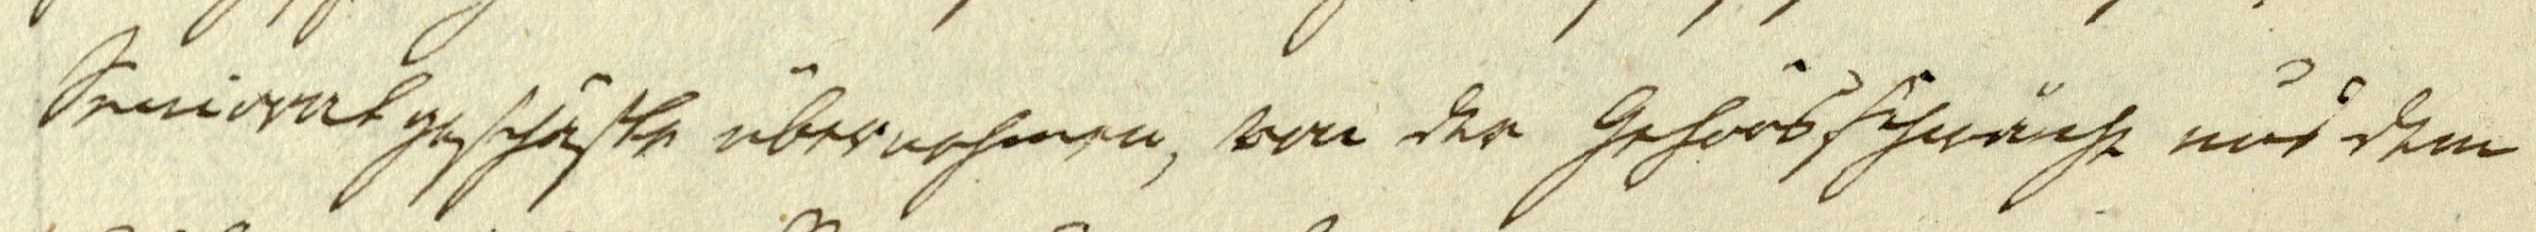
Senioratgeschäfte übernehmen, von der Gehörsschwäche und dem
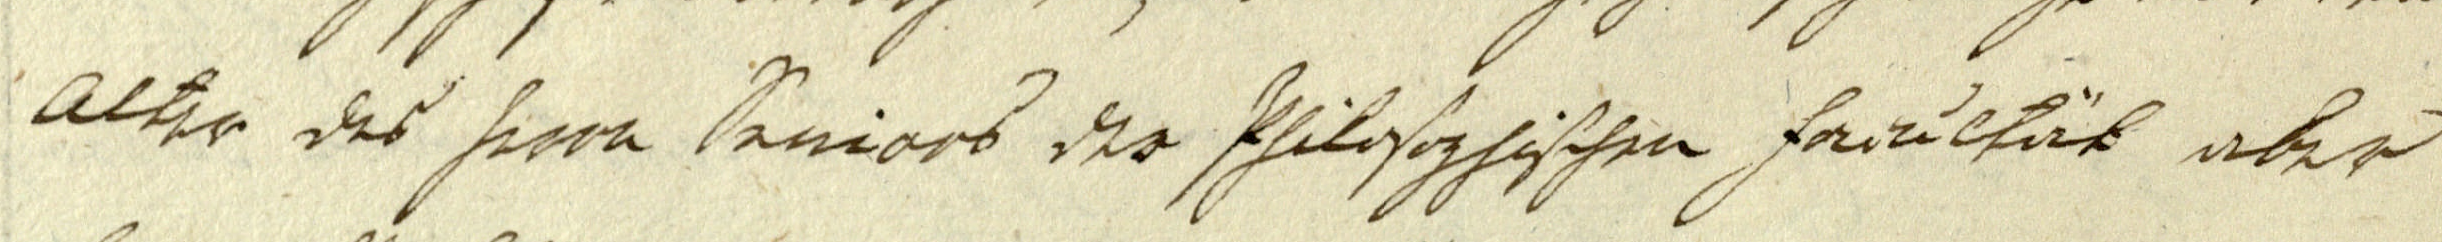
Alter des herrn Seniors der Philosophischen Facultät aber
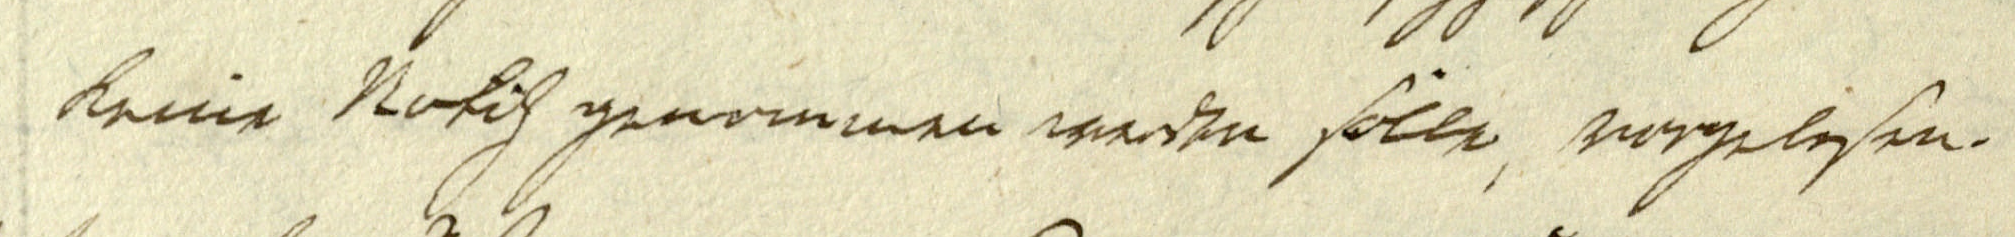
keine Notiz genommen werden solle, vorgelesen.
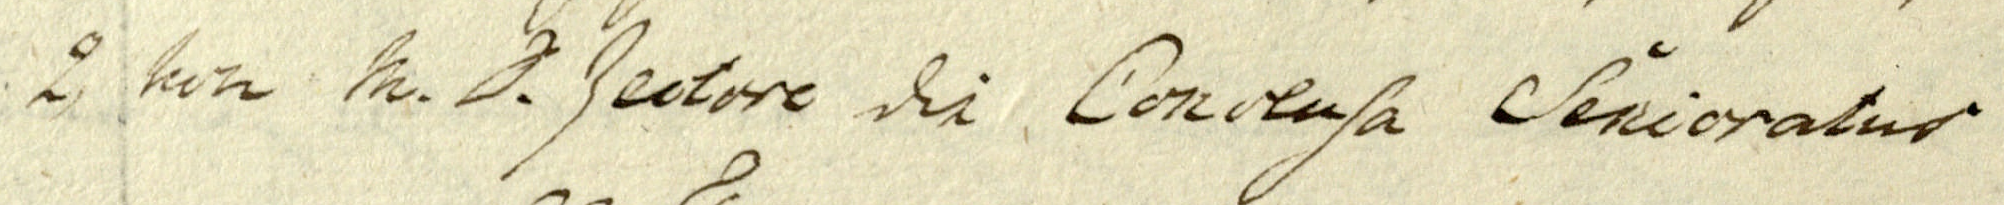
2, Von M. D. Rectore die Conclusa Senioratus
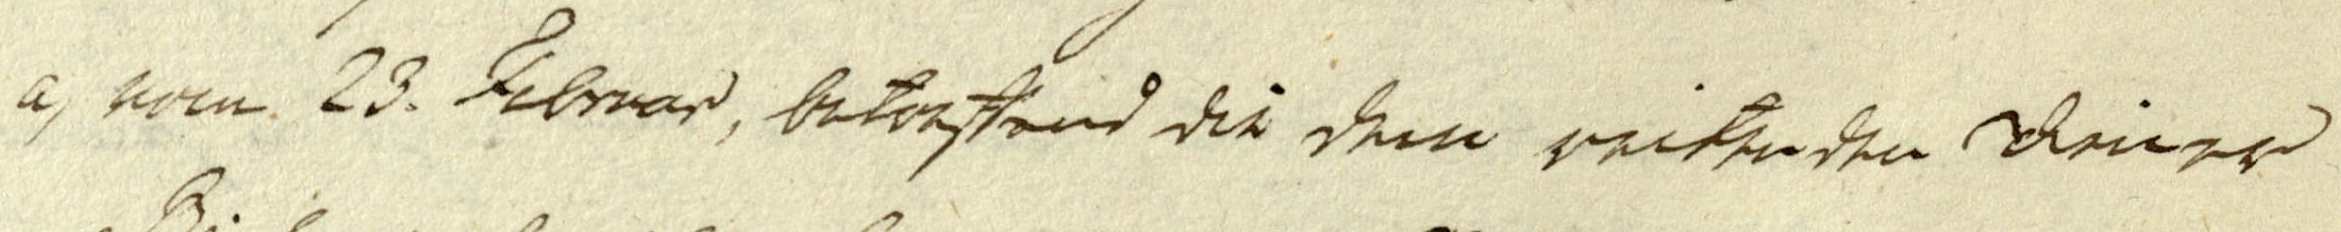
a, vom 23. Februar, betreffend die dem reitenden Diener
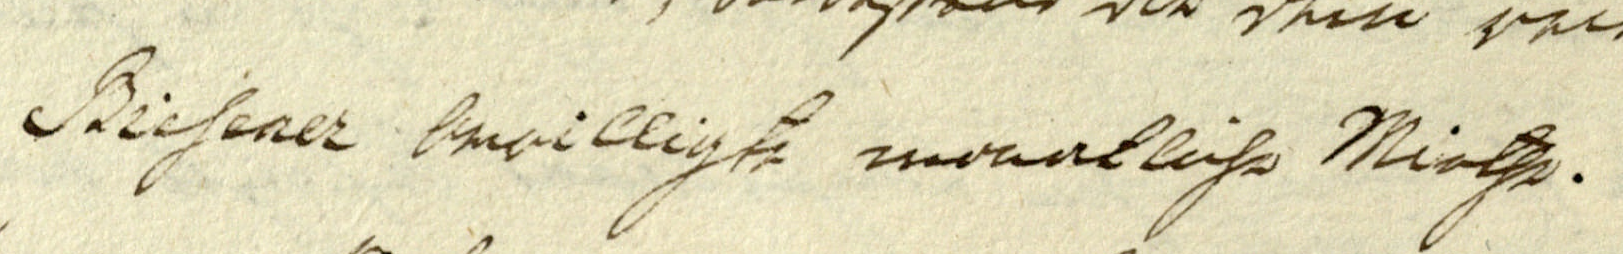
Biesener bewilligte monatliche Miethe.
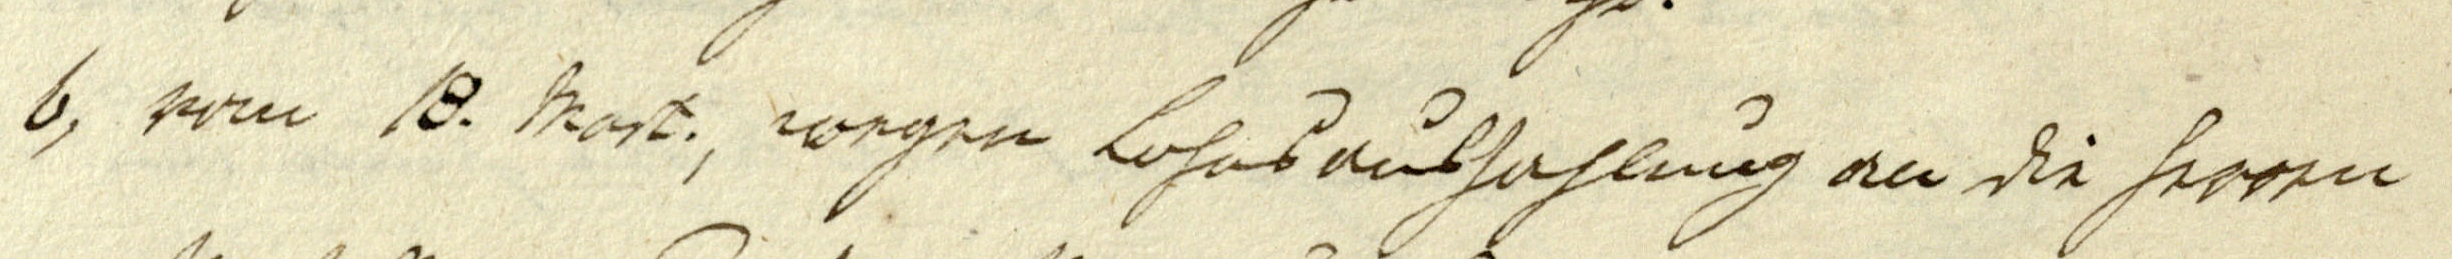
b, vom 18. Mart., wegen Lohnsauszahlung an die Herren
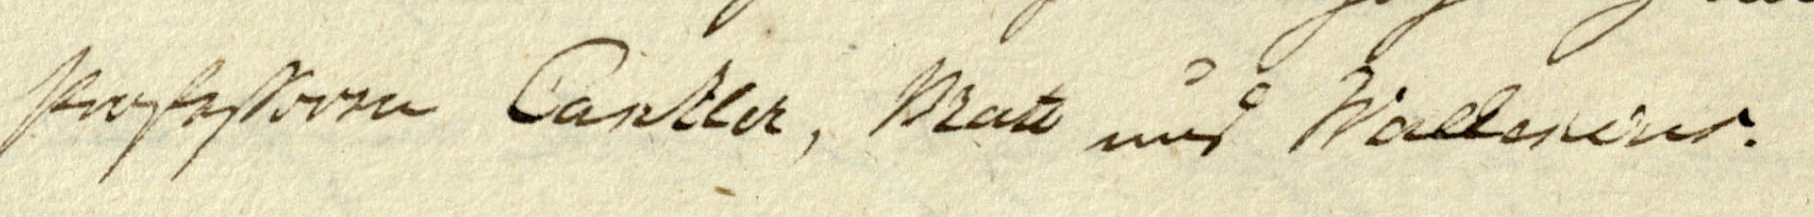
Professoren Canzler, Bratt und Wallenius.
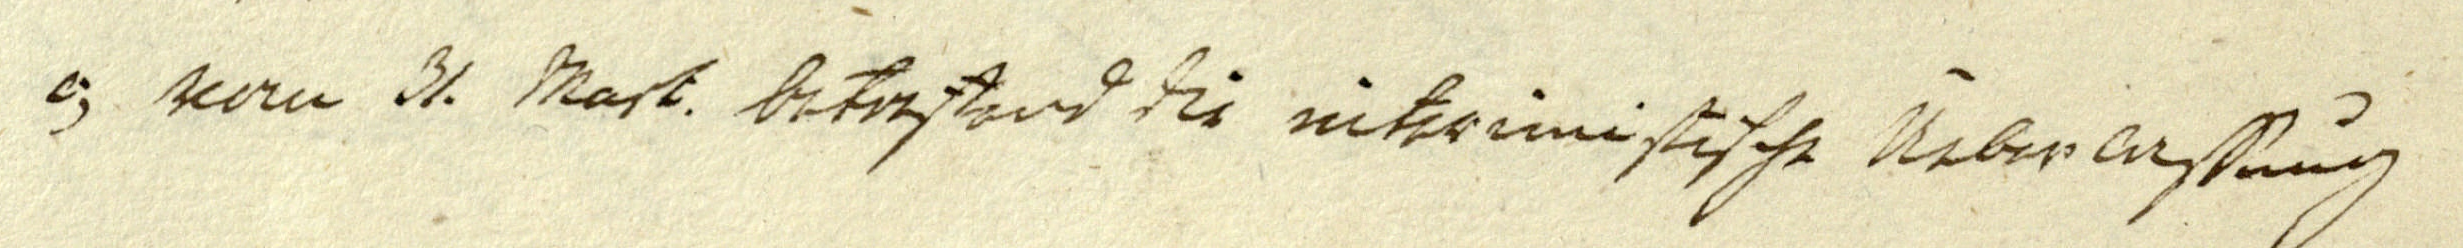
c, vom 31. Mart. betreffend die interimistische Überlassung
